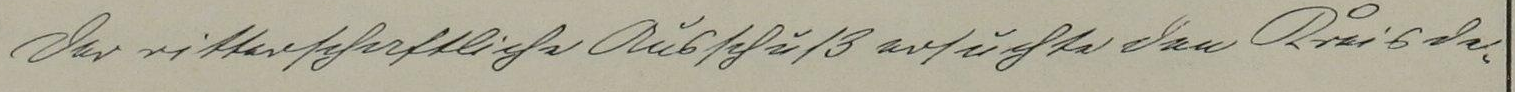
Der ritterschaftliche Ausschuß ersuchte den Kreisde-
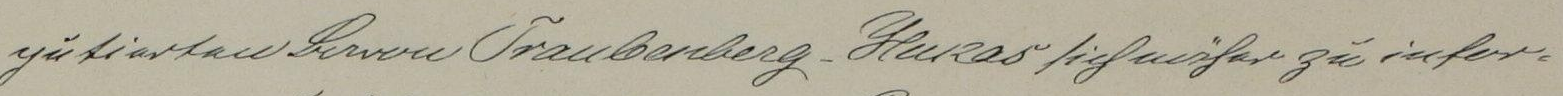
putierten Baron Traubenberg-Hukas sich näher zu infor-
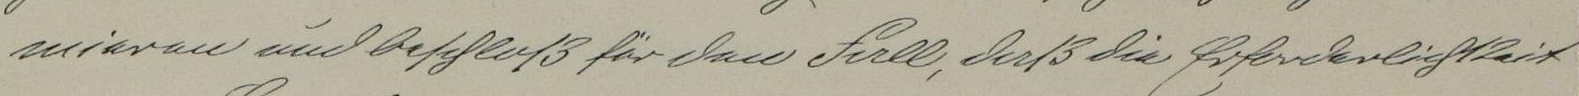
mieren, und beschloß für den Fall, daß die Erforderlichkeit
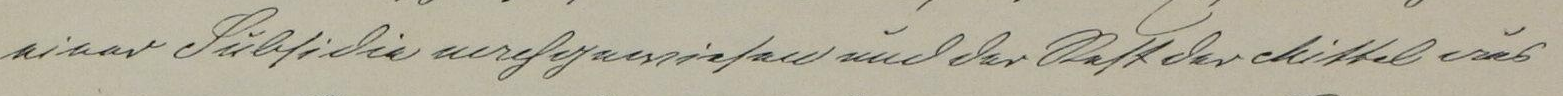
einer Subsidie nachgewiesen und der Rest der Mittel aus
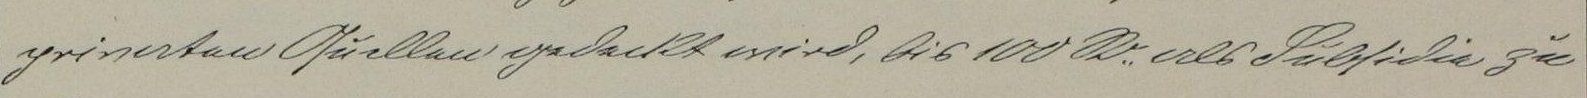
privaten Quellen gedeckt wird, bis 100 R. als Subsidie zu
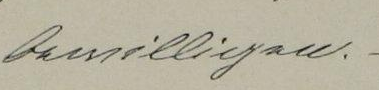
bewilligen.
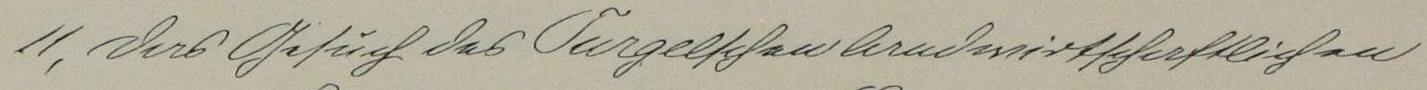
11. Das Gesuch des Turgelschen landwirtschaftlichen
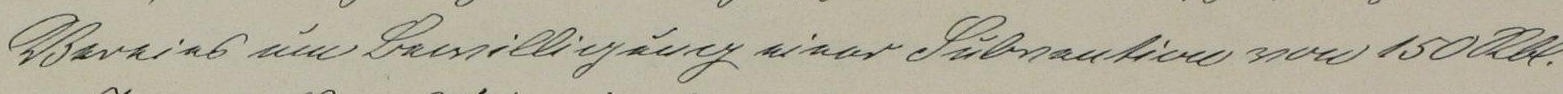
Vereins um Bewilligung einer Subvention von 150 Rbl.
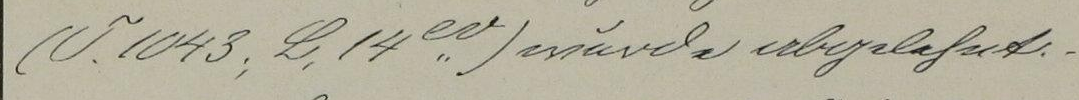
(T.1043; L.14ev) wurde abgelehnt.
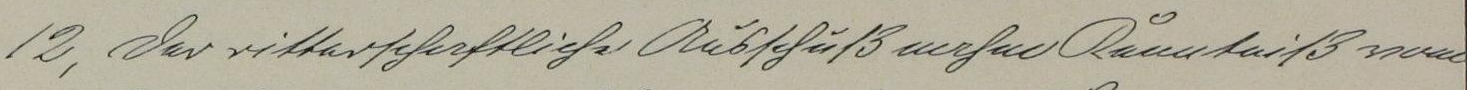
12. Der ritterschaftliche Ausschuß nahm Kenntniß vom
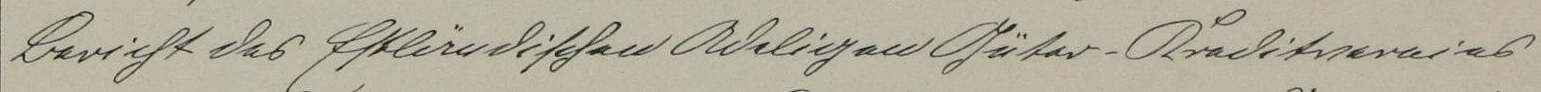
Bericht des Estländischen Adeligen Güter-Kreditvereins
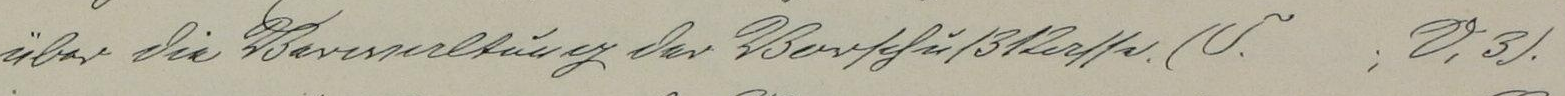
über die Verwaltung der Vorschußkasse (T.; V.3).
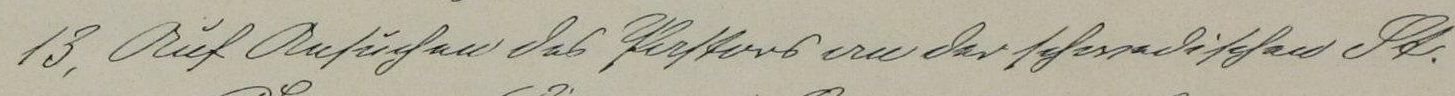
13. Auf Ansuchen des Pastors der schwedischen St.
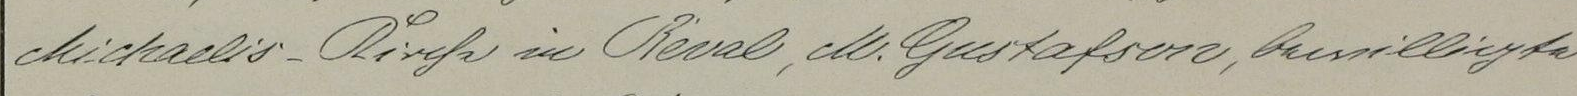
Michaelis-Kirche in Reval, M. Gustafson, bewilligte
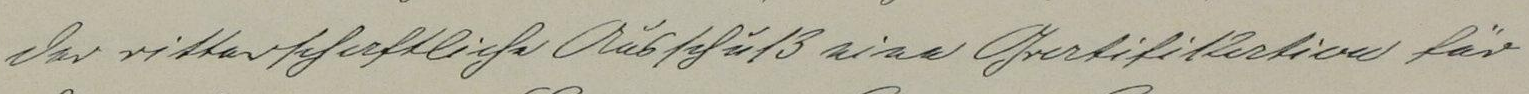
der ritterschaftliche Ausschuß eine Gratifikation für
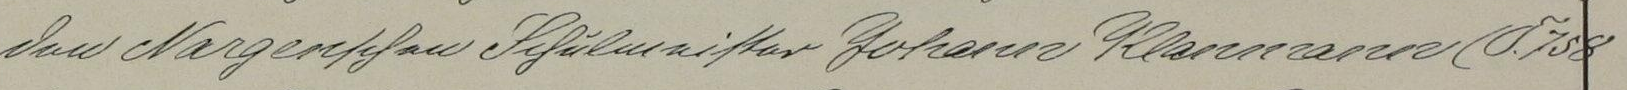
den Nargenschen Schulmeister Johann Klanmann (T.758
